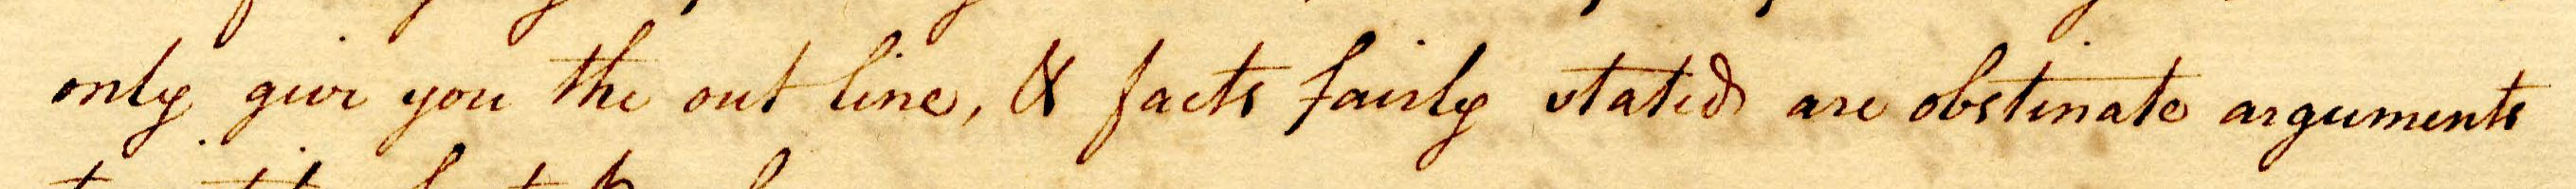only give you the out line, & facts fairly stated are obstinate arguments
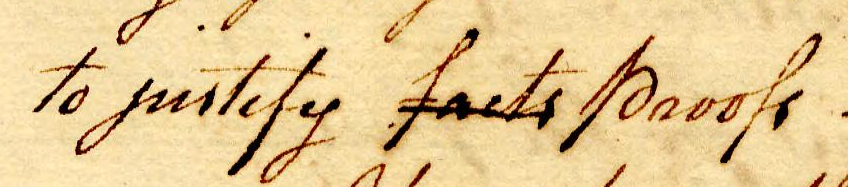to justify facts proofs
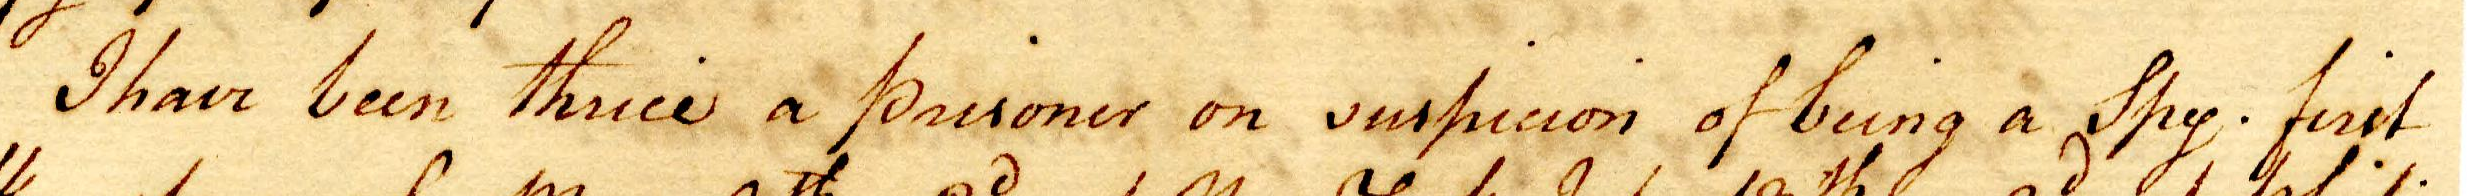I have been thrice a prisoner on suspicion of being a Spy first
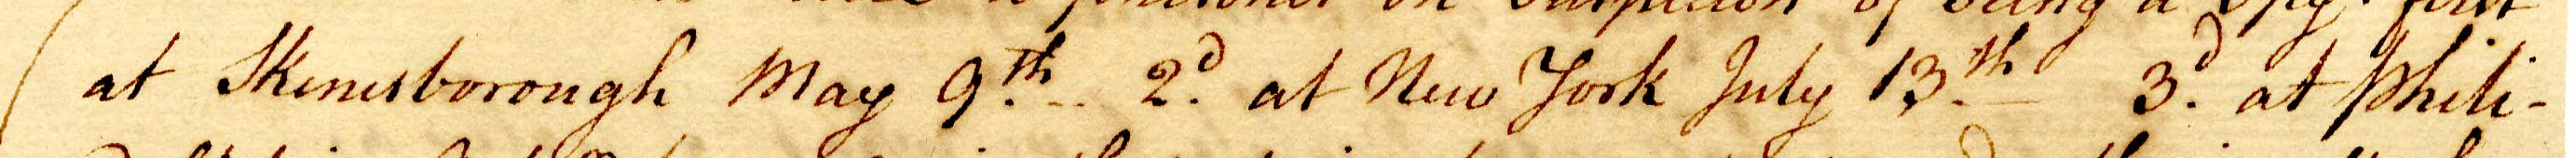at Skenesborough May 9^th. 2^d. at New York July 13^th. 3^d. at Phili-
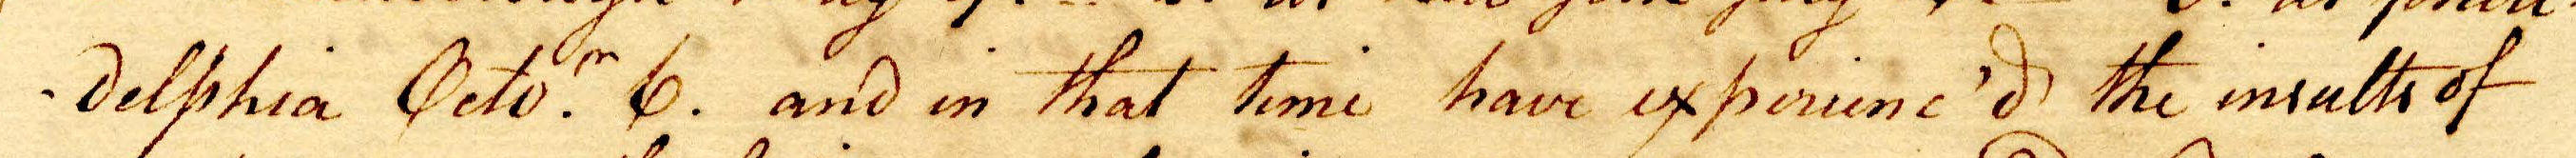-delphia Octo^r. 6. and in that time have experienc'd the insults of
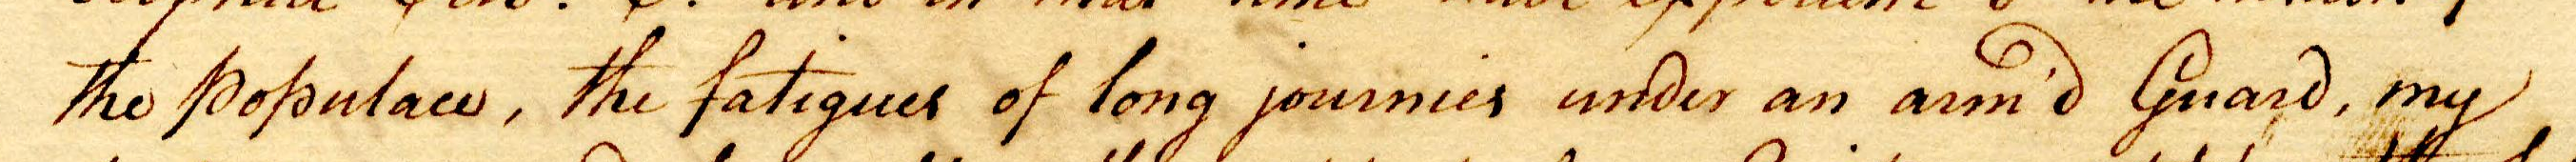the populace, the fatigues of long journies under an arm'd Guard, my
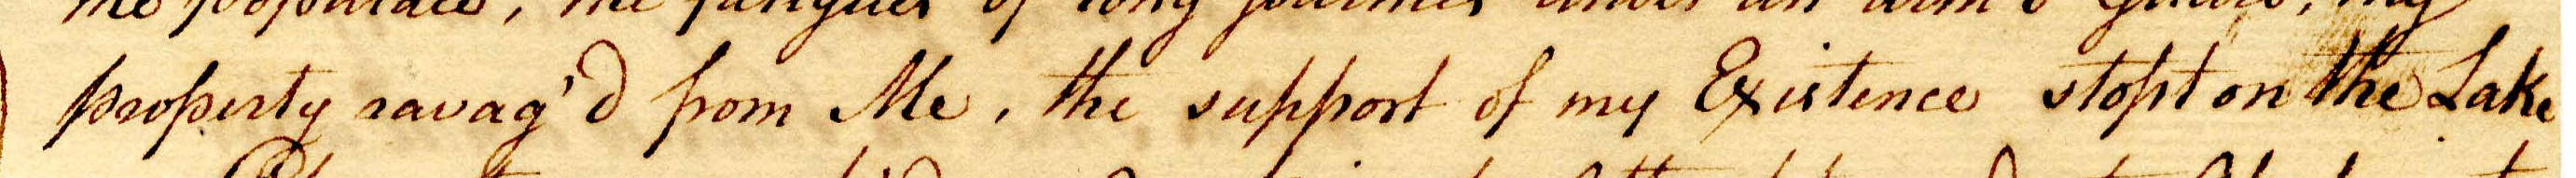property ravag'd from Me, the support of my Existence stopt on the Lake
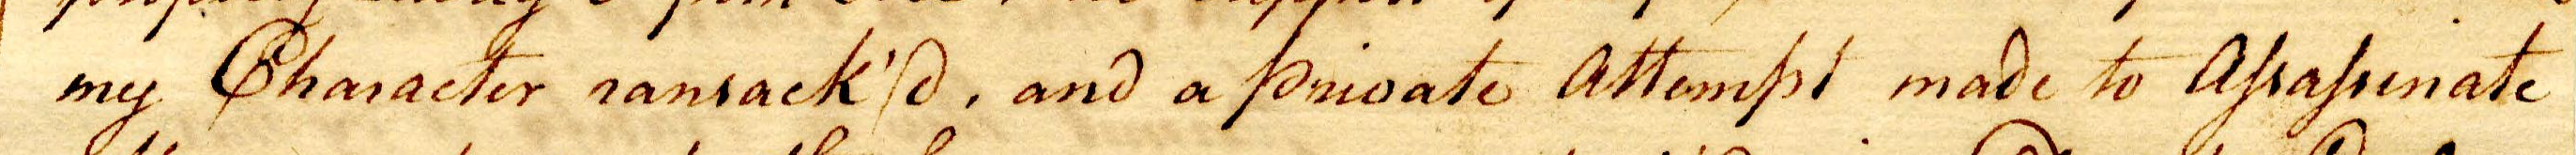my Character ransack'd, and a private Attempt made to Assassinate
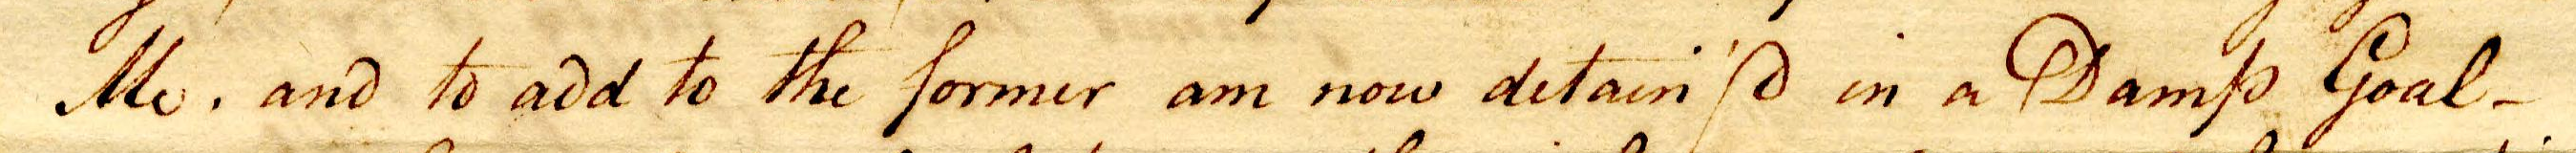Me, and to add to the former am now detain'd in a Damp Goal.
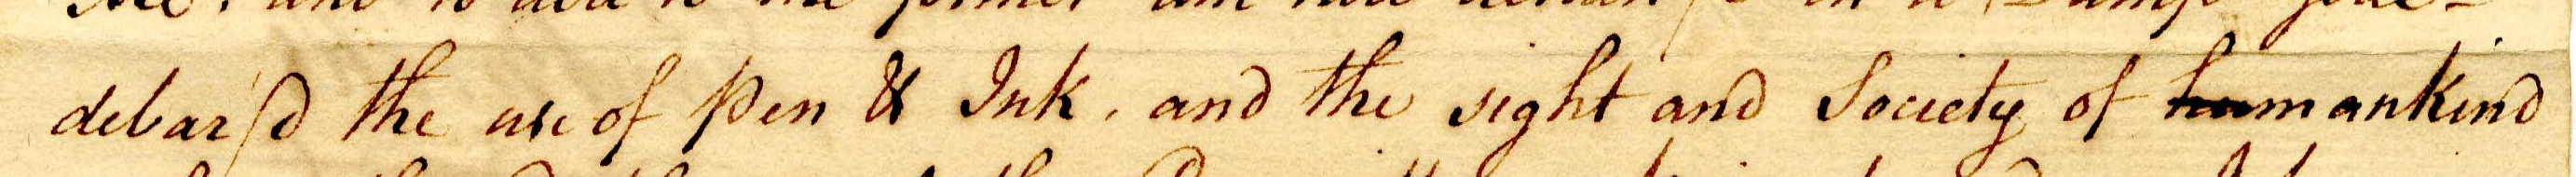debar'd the use of pen & Ink, and the sight and Society of humankind
